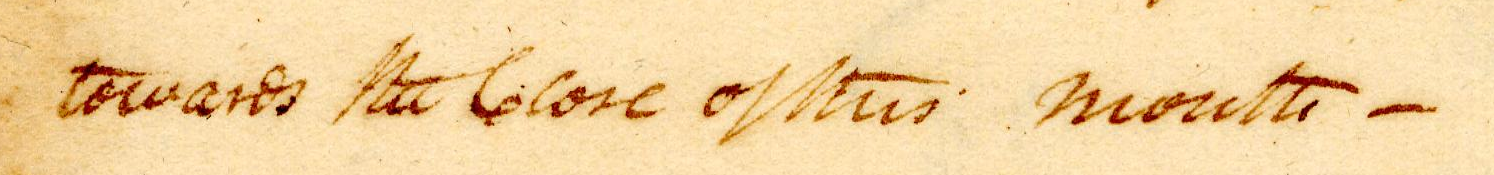towards the Close of this month.
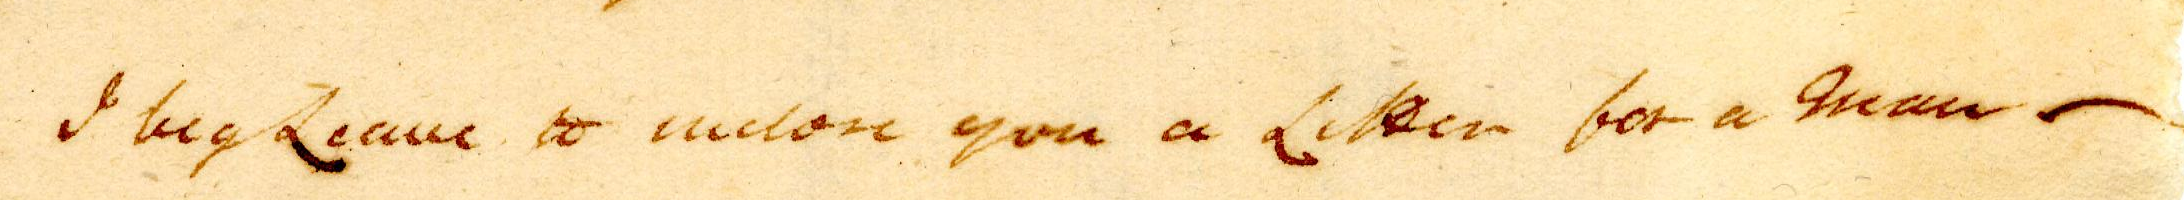I beg Leave to enclose you a Lien for a man-
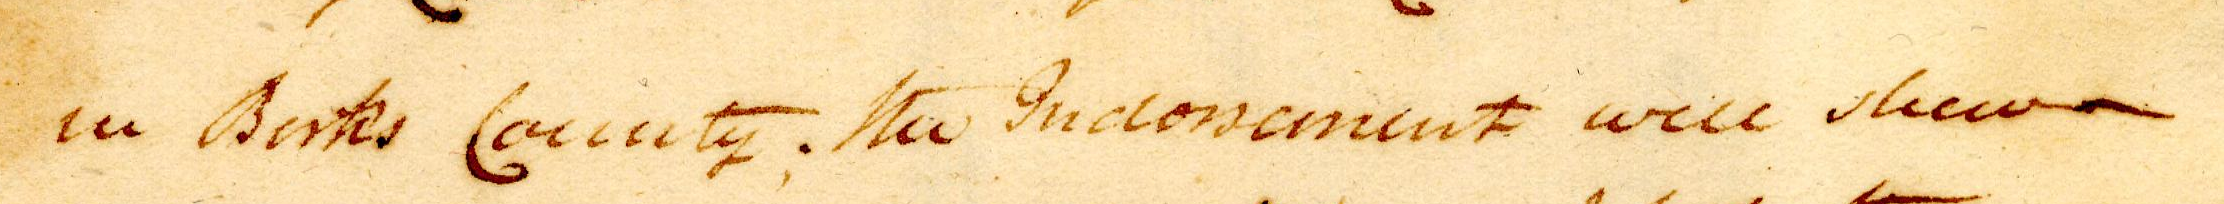in Borks County. the Indonanent will shew
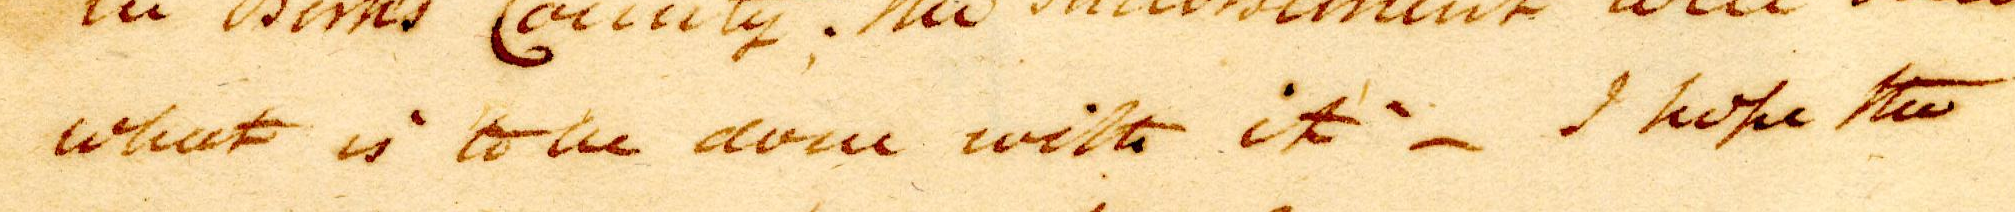what is to be done with it. I hope the
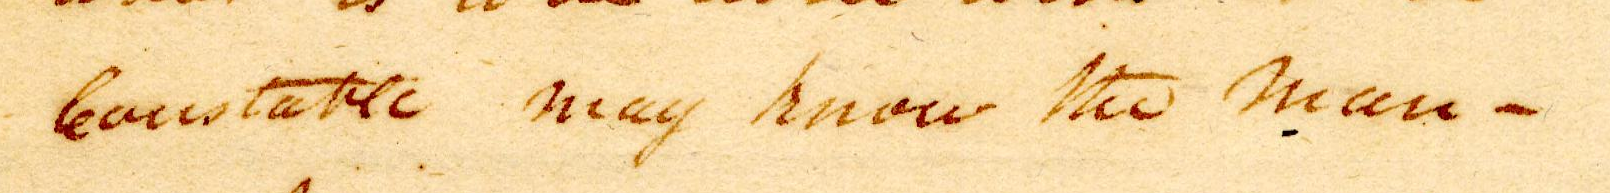Constable may know the Man.
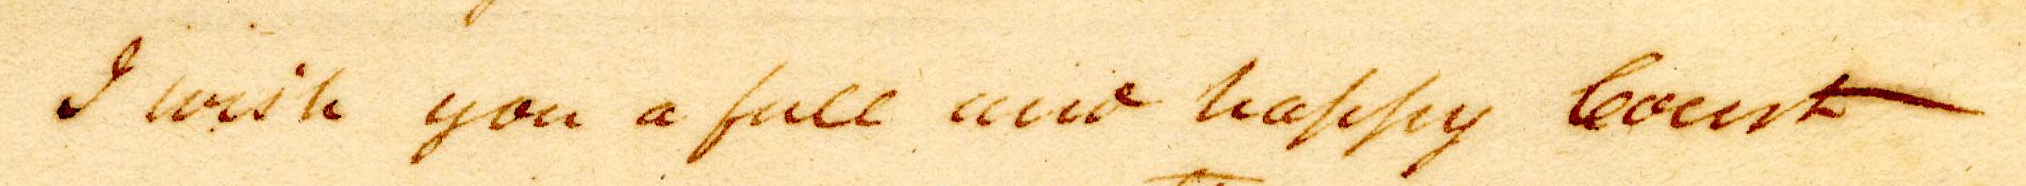I wish you a full and happy Court
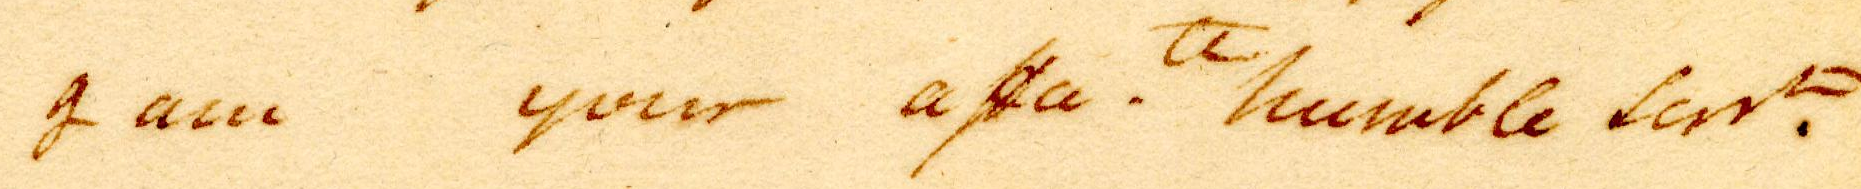I am your affec^te. humble Serv^t.
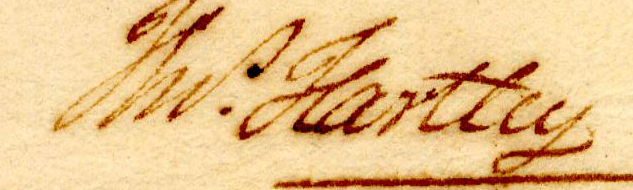Tho^s. Hartley
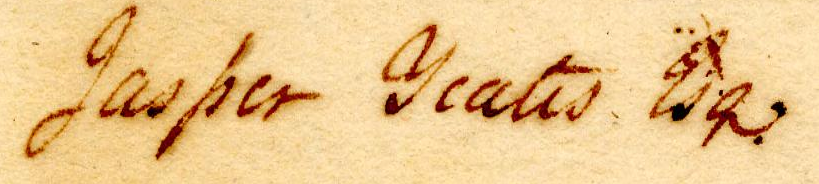Jasper Yeates Esq^r
